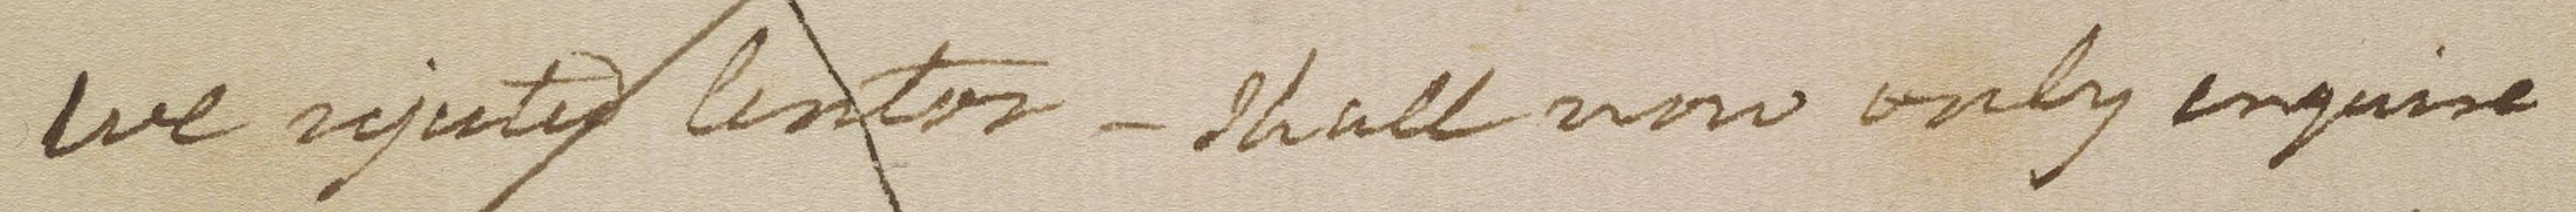We rejected lentor, shall now only inquire
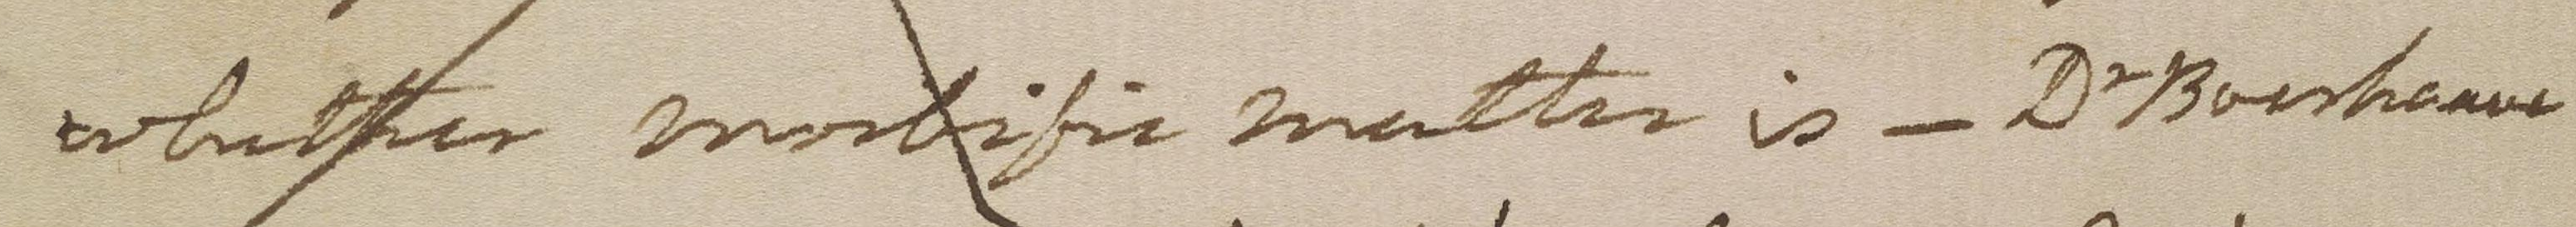whether morbific matter is- D^r Boerhaave
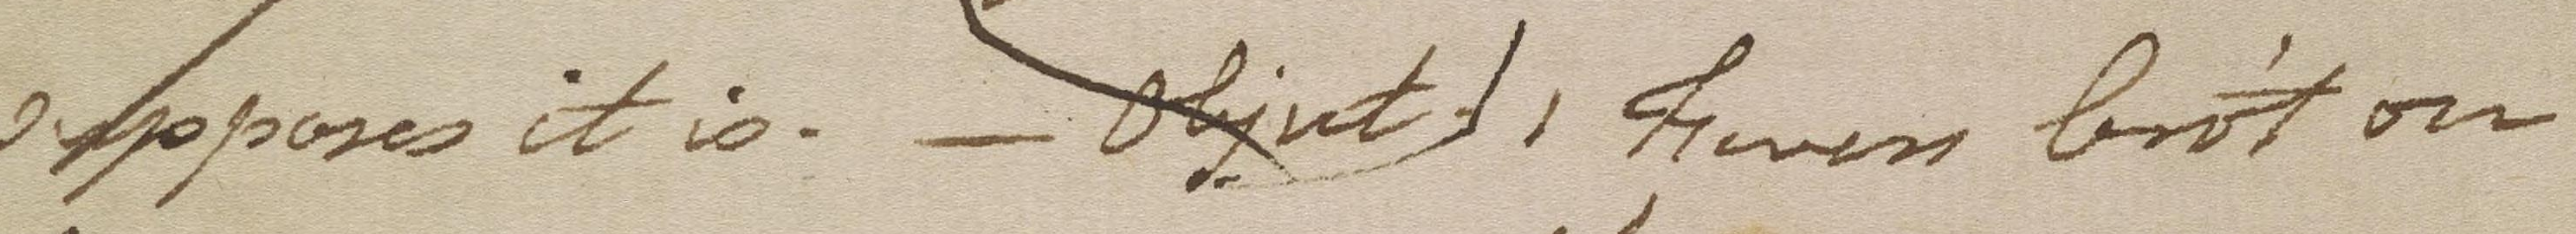supposes it is. Object 1 Fever bro't on
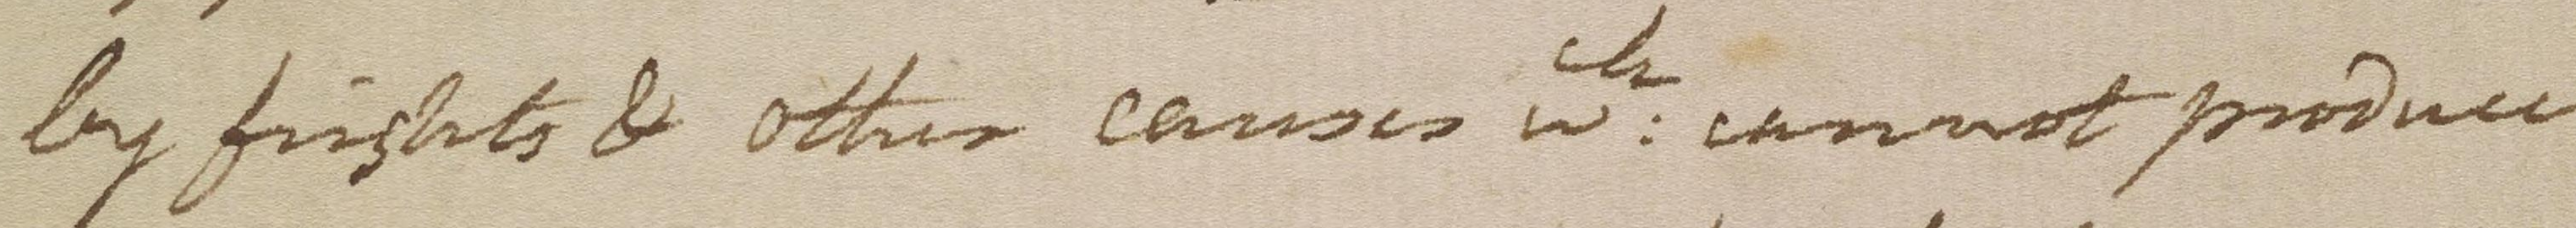by frights & other causes w^ch: cannot produce
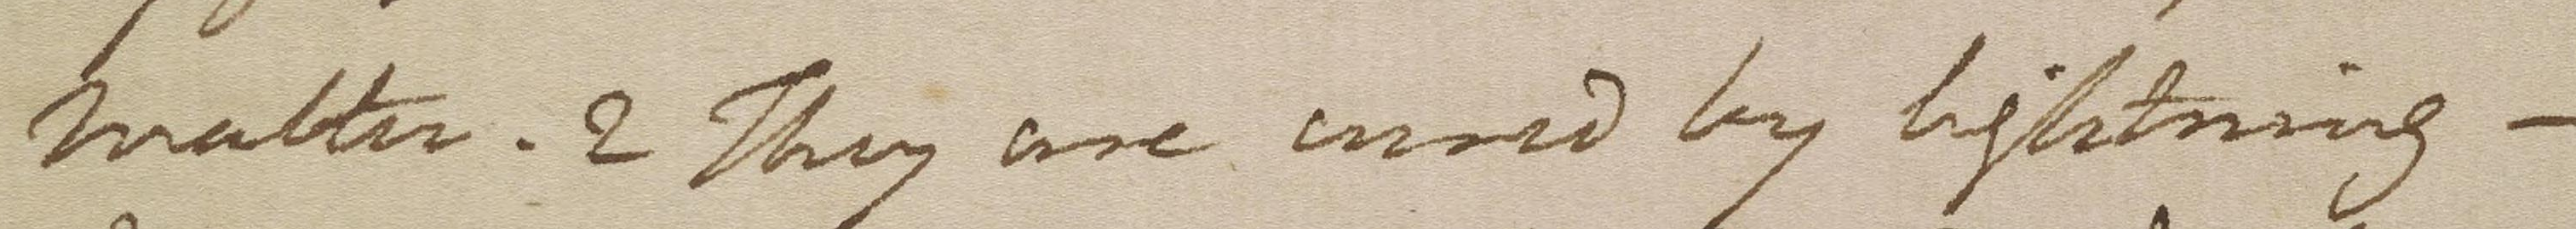matter. 2 They are cured by lightning,
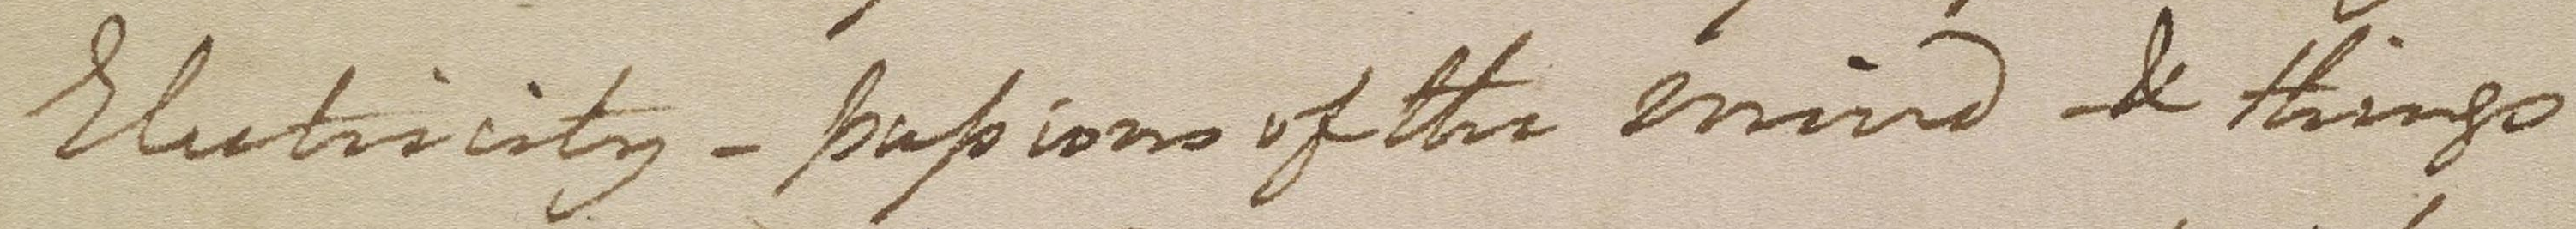Electricity- passions of the mind- & things
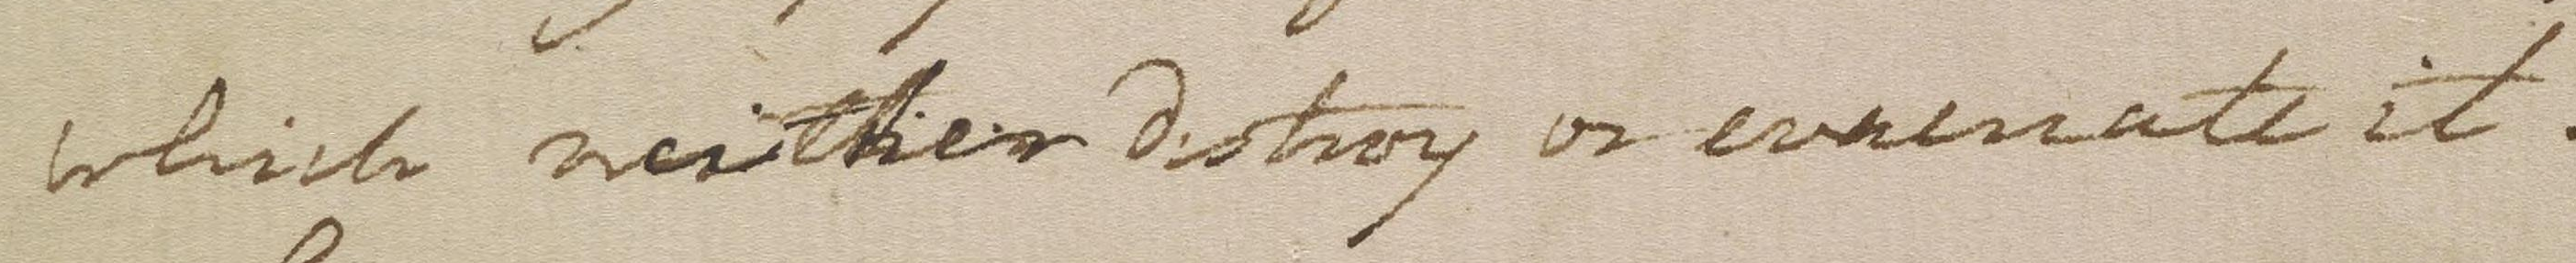which neither destroy or evacuate it.
